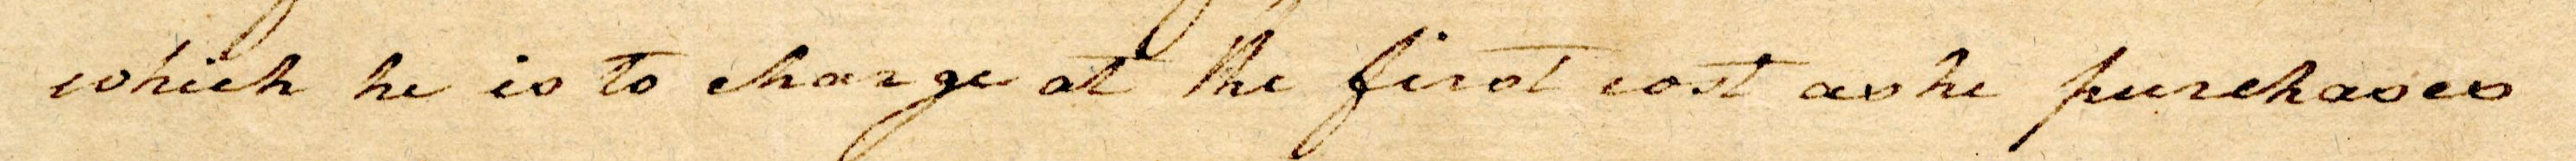which he is to charge at the first cost as he purchases
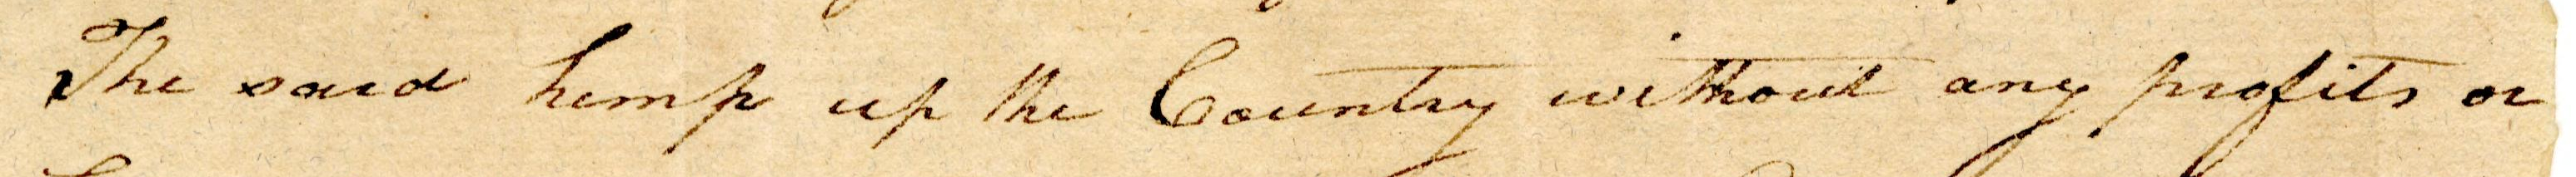The said hemp up the Country without any profits or
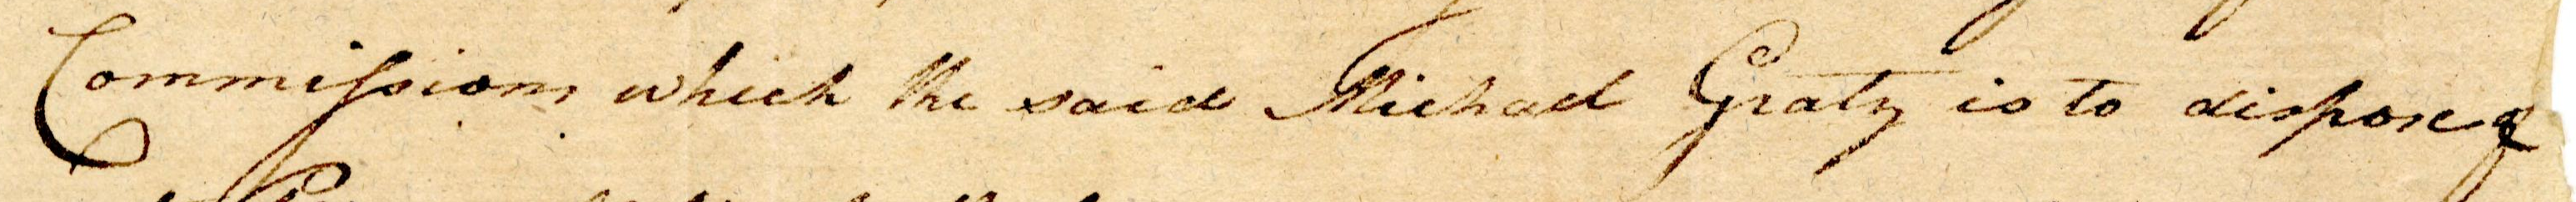Commissions which the said Michael Gratz is to dispose
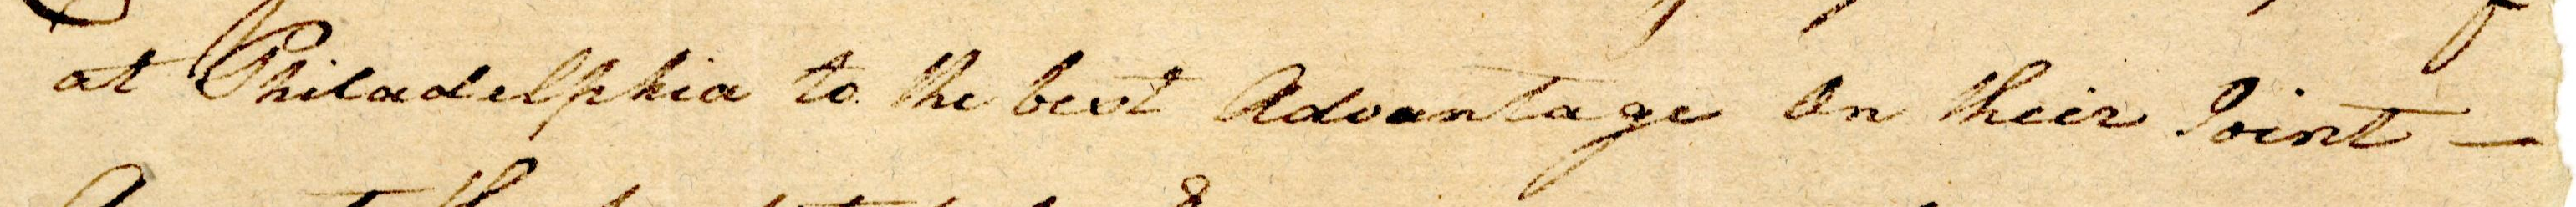at Philadelphia to the best Advantage on their Point-
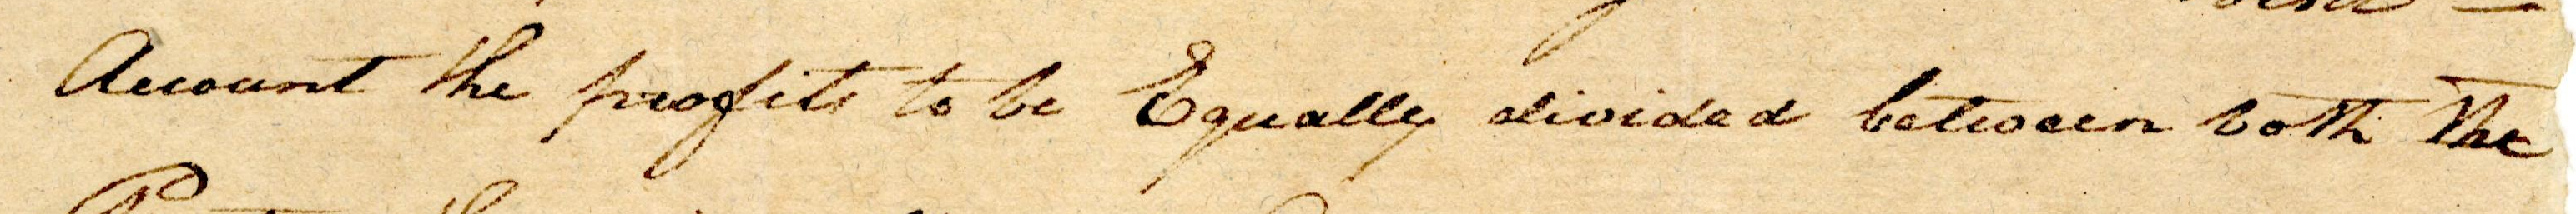Account the profits to be Equally divided between both The
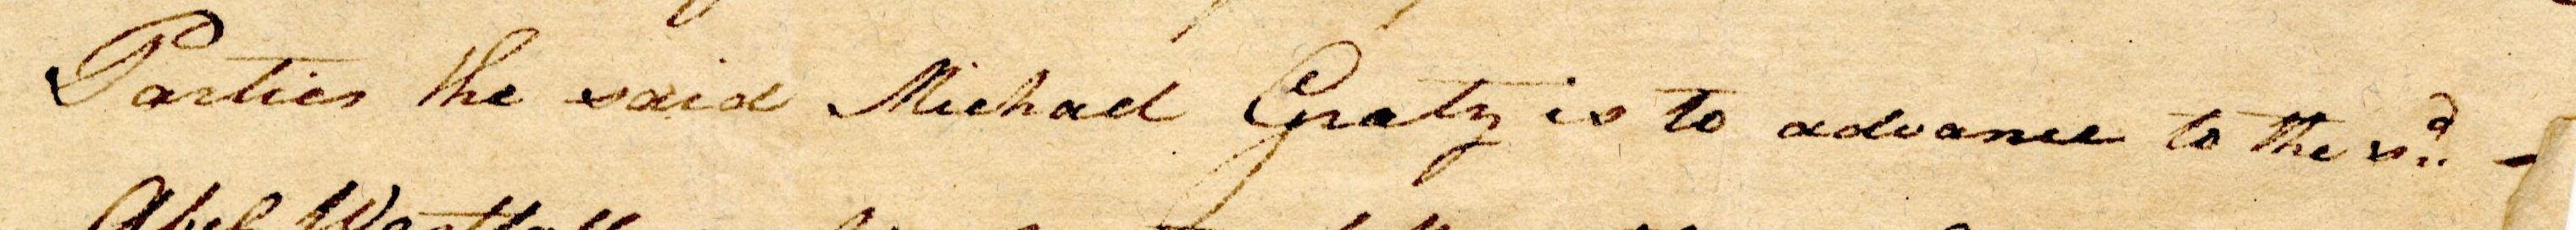Parties the said Michael Gratz is to advance to the s^d.
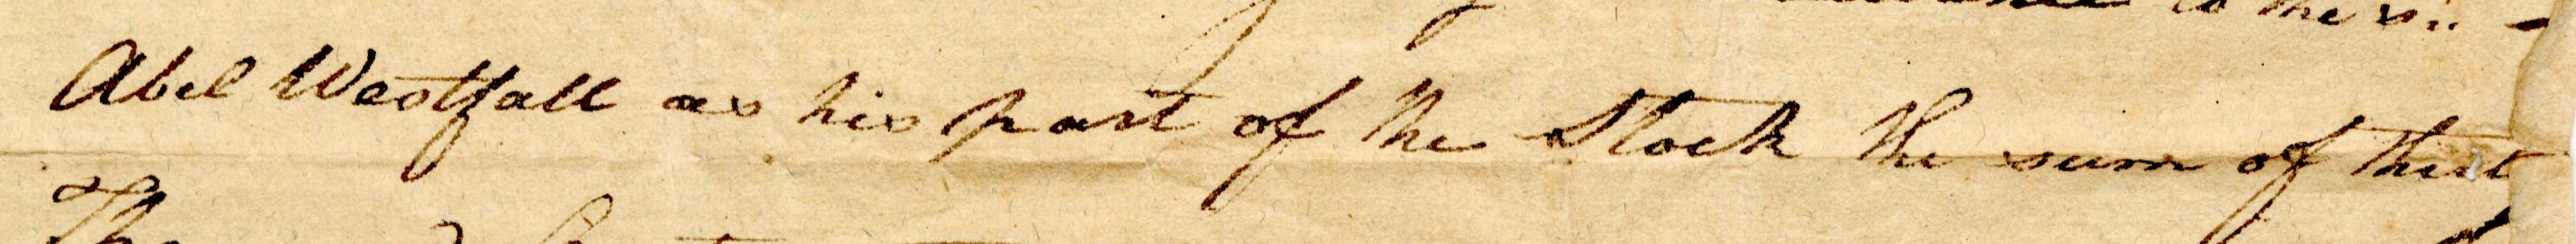Abel Westfall as his part of the Stock the sum of this
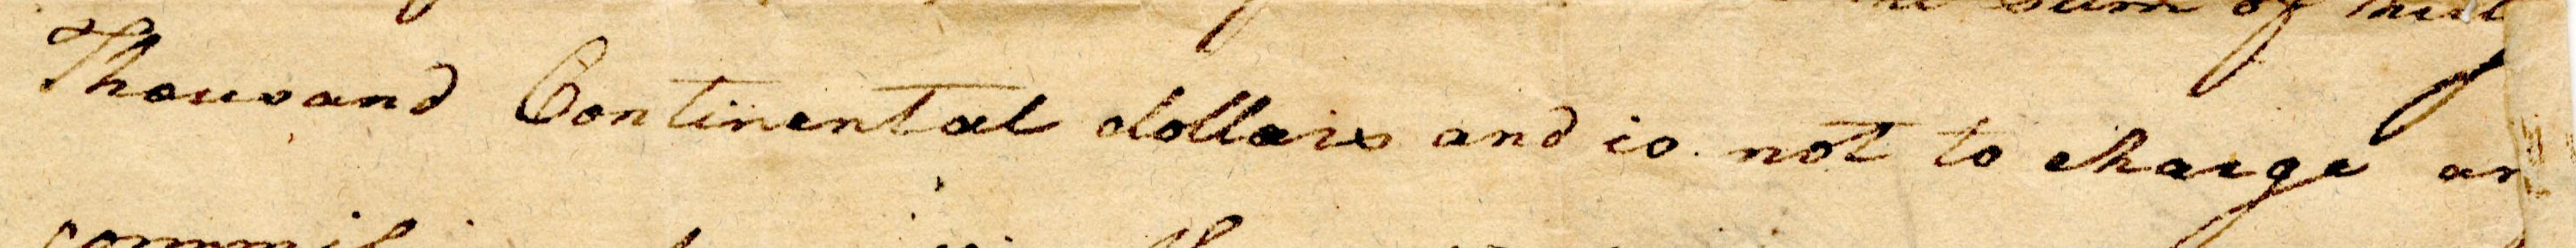Thousand Continental dollars and is not to charge an
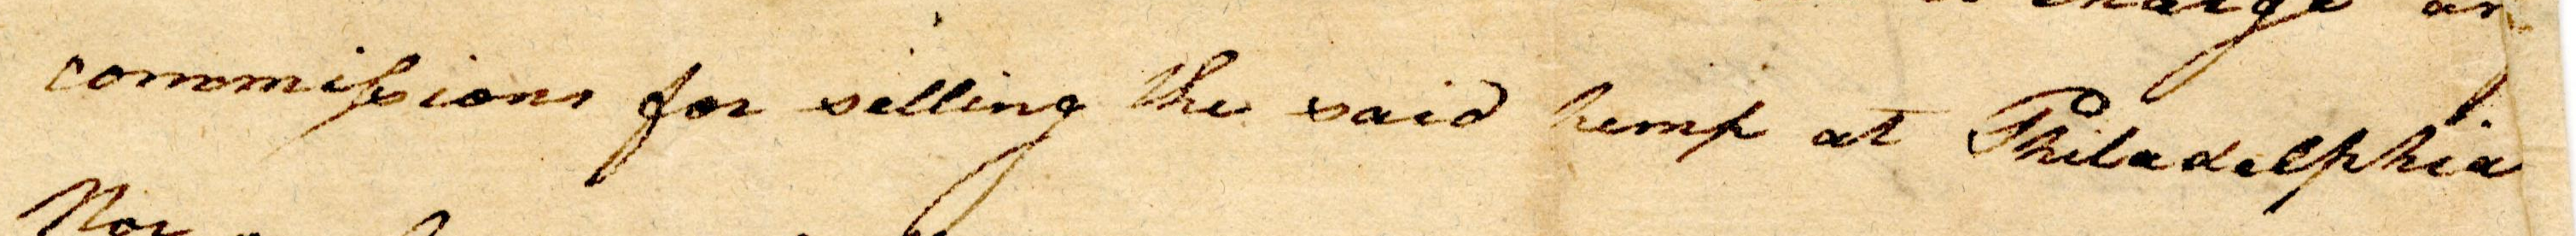commissions for selling the said hemp at Philadelphia
